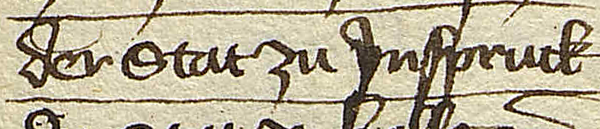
der Stat ʒu Inſpruck
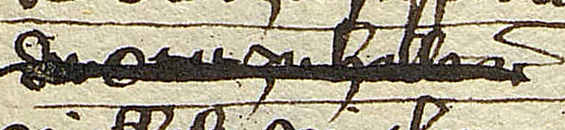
der Stat ʒu halle ec*
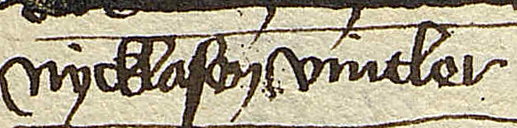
Nycklaſen vincler
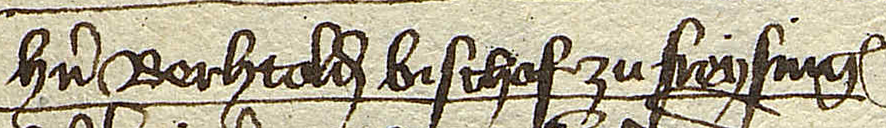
hn* Berhtold* biſchof ʒu freyſing*
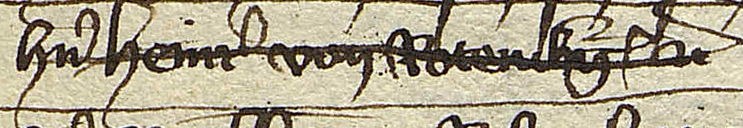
hn* heinr* von Rotemb*g ec*
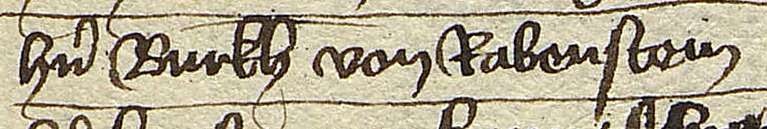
hn* Burkh* von Rabenſtein
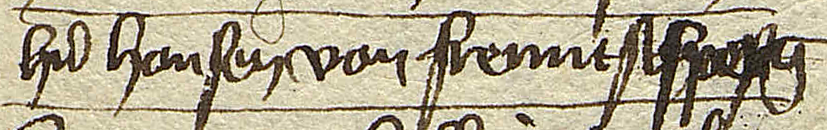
hn* hanſen von freuntſtſperg
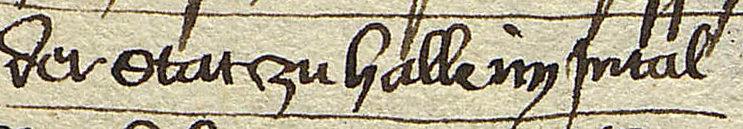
der Stat cʒu halle im Intal
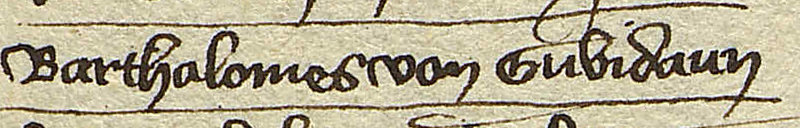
Bartholomes bon Guvidaun
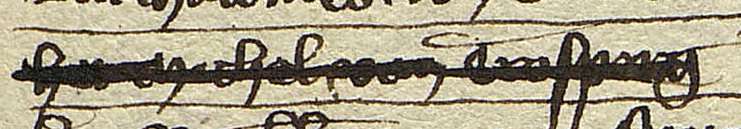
her Michel von Troſperg
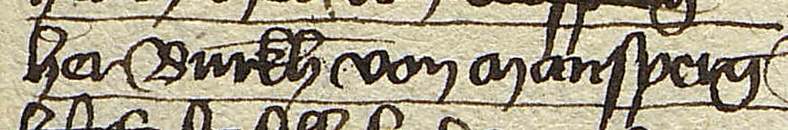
her Burkh* von Manſperg*
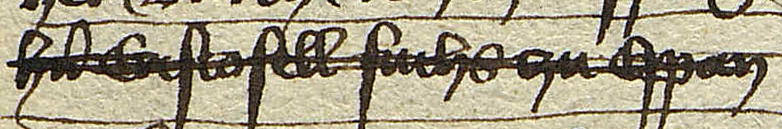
hn* Criſtofell fuchs cʒu Eppan
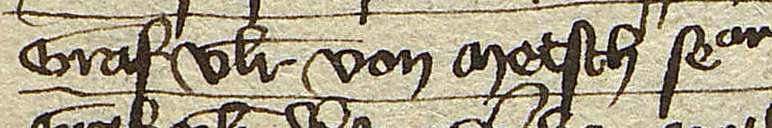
Graf vlr* von Metſch ſe*
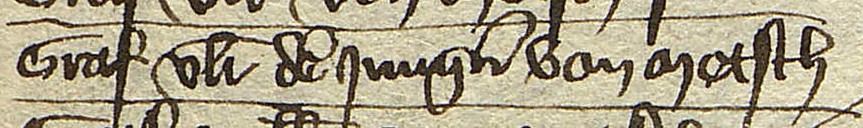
Graf vlr* de* Iungn* von Metſch
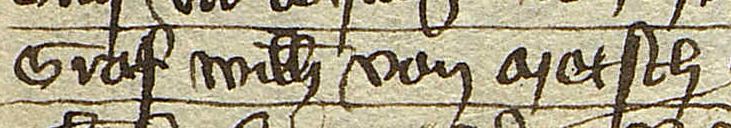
Graf wilh* von Metſch
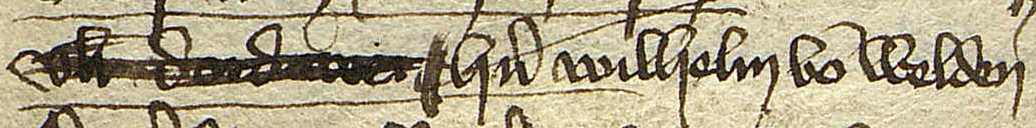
vlr* d%% %%%% hn* wilhelm vo* welden
